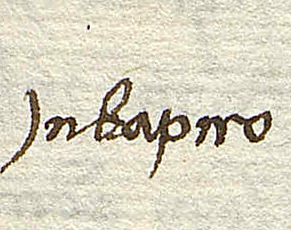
In bapiro
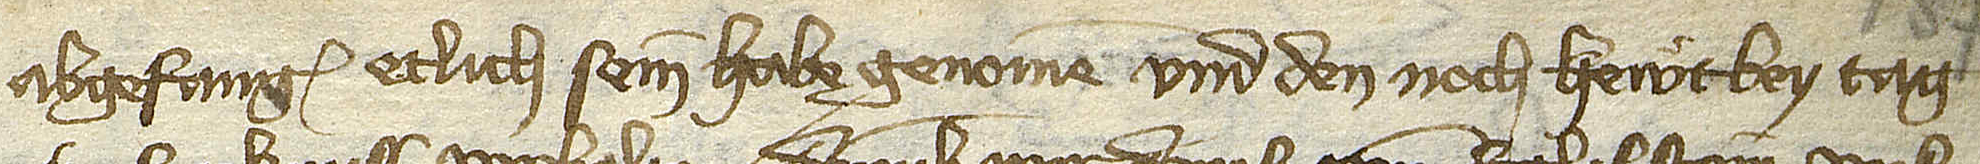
abgefang* etlich ſein habe genome* vnd den noch hewt bey tag
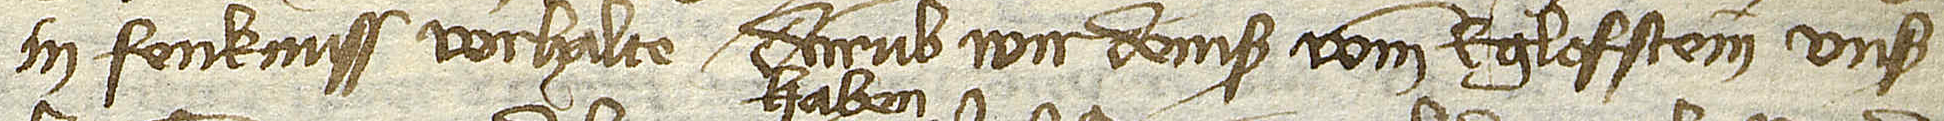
in fenknuſſ vorhalte / daru*b wir demſ* vom* Eglofſtein vnſ*
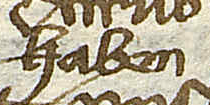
haben
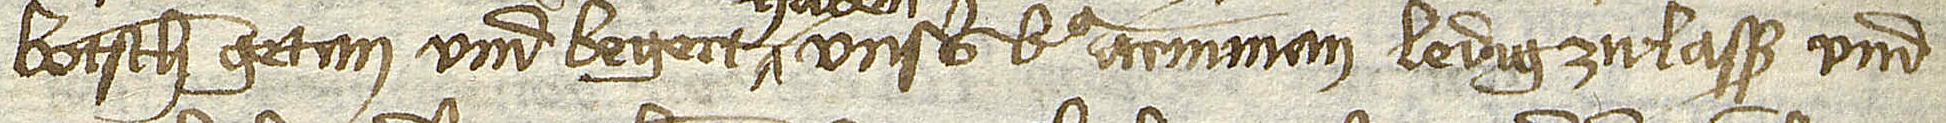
botſch* getan vnd begert vnſ*s b* armman ledig ʒu laſſ* vnd
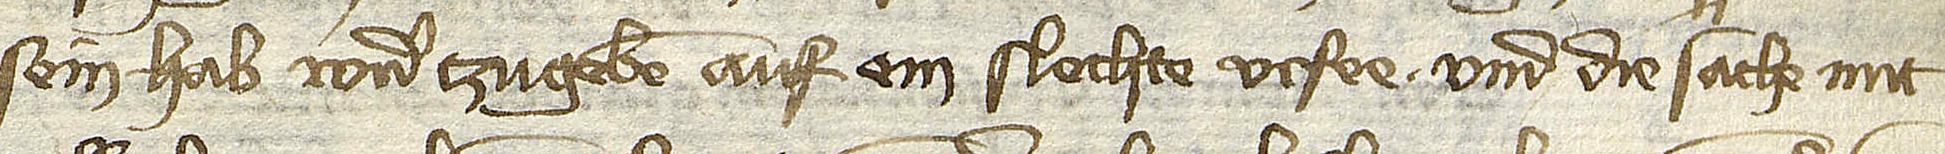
ſein hab wid* cʒugebe* auf ein ſlechte vrfee . vnd die ſache mit
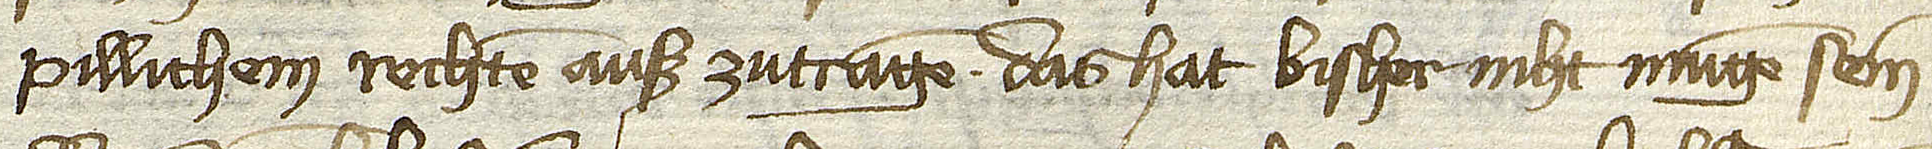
pillichem rechte* auſʒ ʒutrage* . das hat biſher niht muge* ſein*
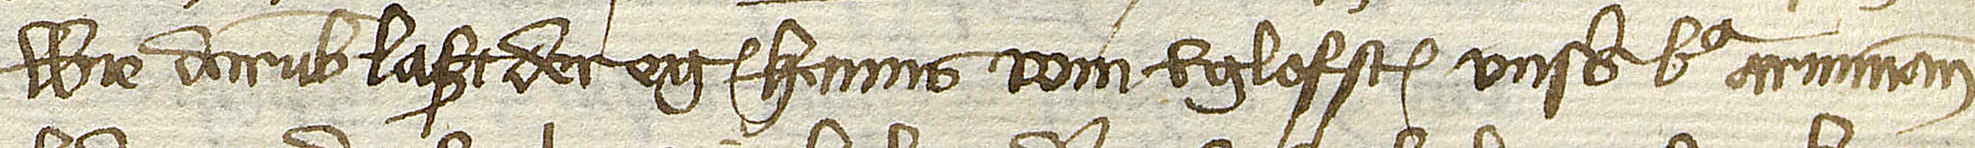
Wie daru*b laſʒt der eg* hanns von Eglofſt* vnſ*s b* armman*
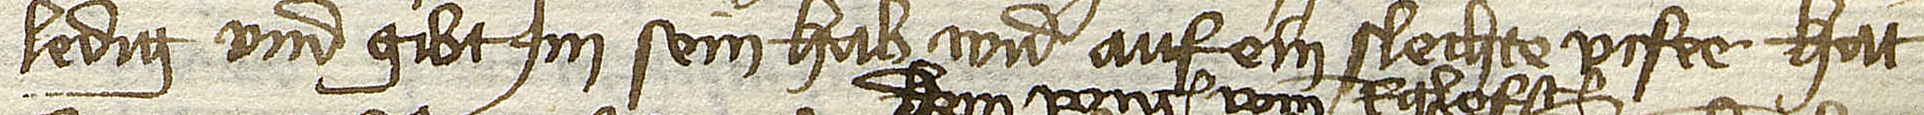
ledig vnd gibt Im ſein hab wid* auf ein ſlechte vrfee . Hat
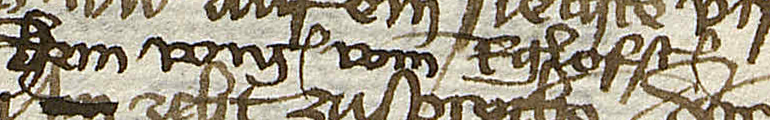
dem vorg* vom Egloſft*
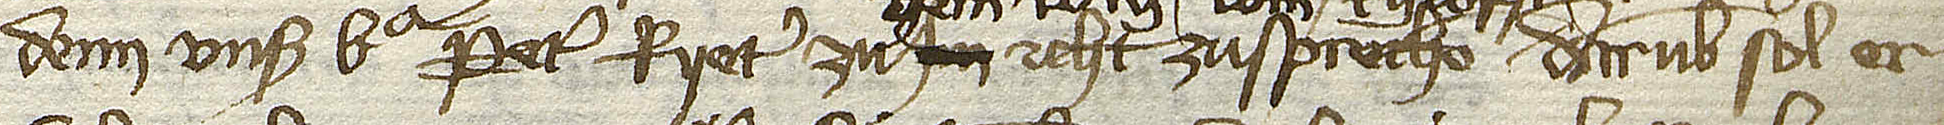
denn vnſ* b* Pet* Ryet* ʒu Im icht ʒuſpreche* / Daru*b ſol er
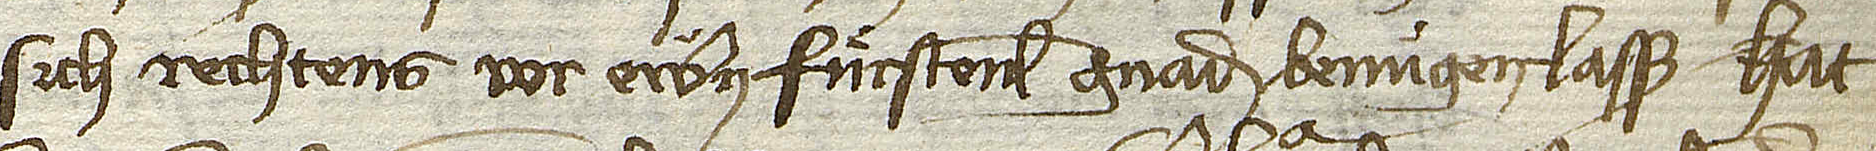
ſich rechtens vor ew*n fürſtenl* gnad* benügen laſſ* / Hat
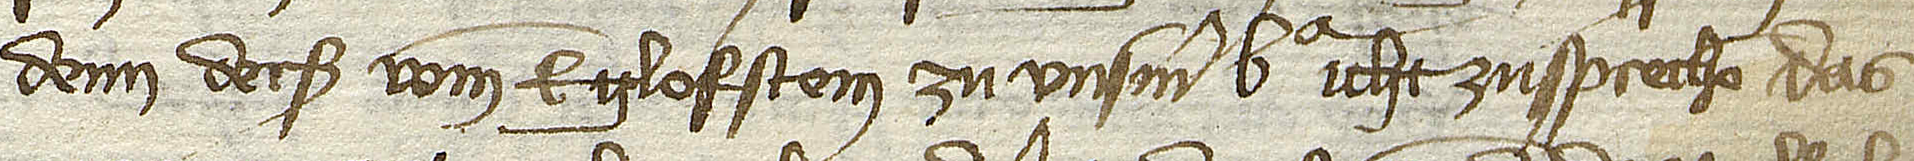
denn derſ* vom* Eglofſtein ʒu vnſ*m b* icht ʒuſreche* / das
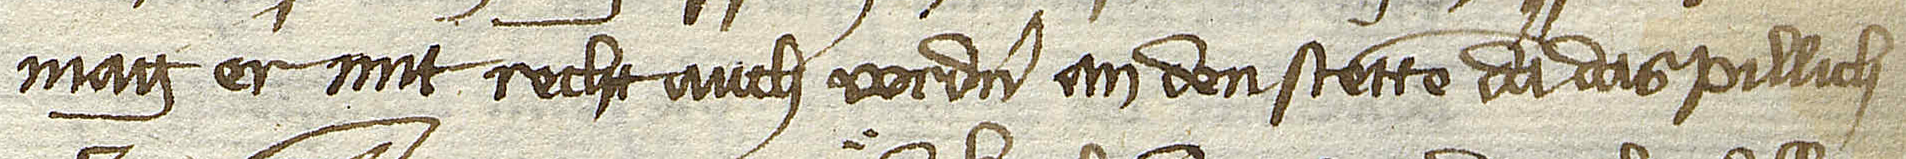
mag er mit recht auch vord*n an den ſtette* da das pillich
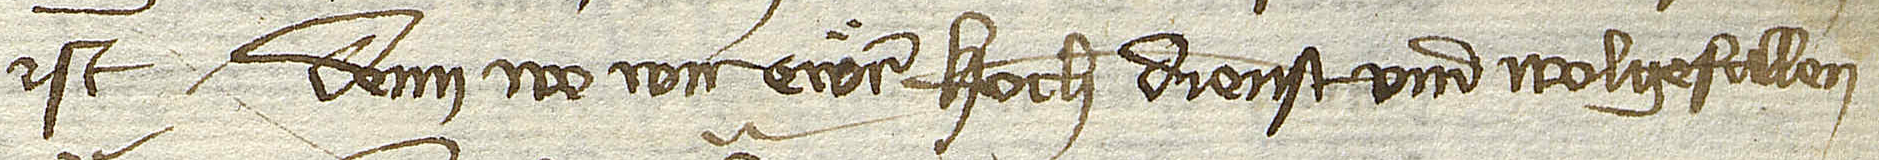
iſt / Denn wo wir ew*r hoch* dienſt vnd wolgefallen
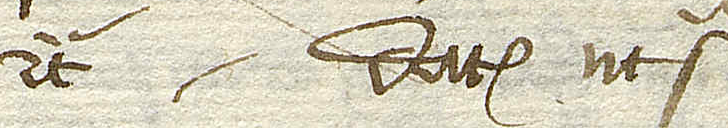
ec* / Dat* ut ſ*
